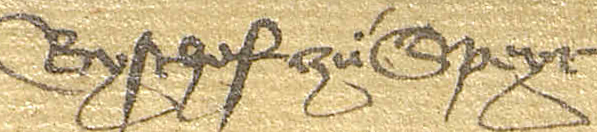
Byſchof cʒü Speyr
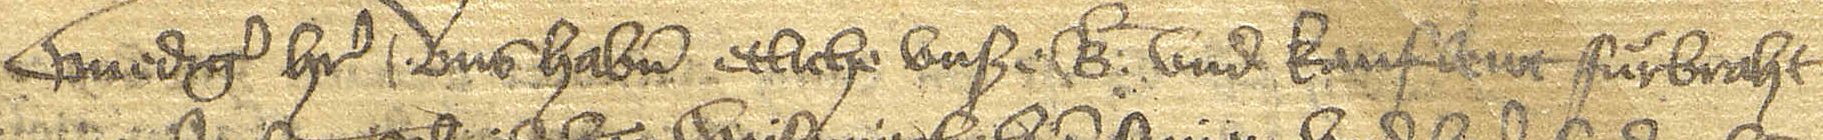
Gnedig* hr* / Vns habn* etliche vnſ*e B* vnd kauflewt fürbraht
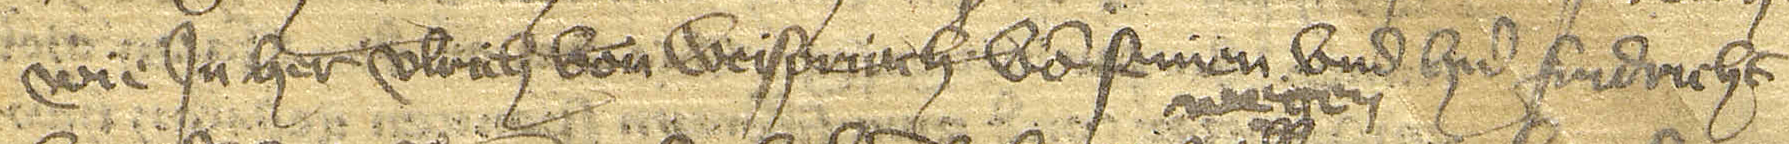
wie In her vlrich von Weiſpriach vo* ſeinen vnd hn* fridrichs
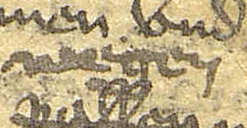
wegen
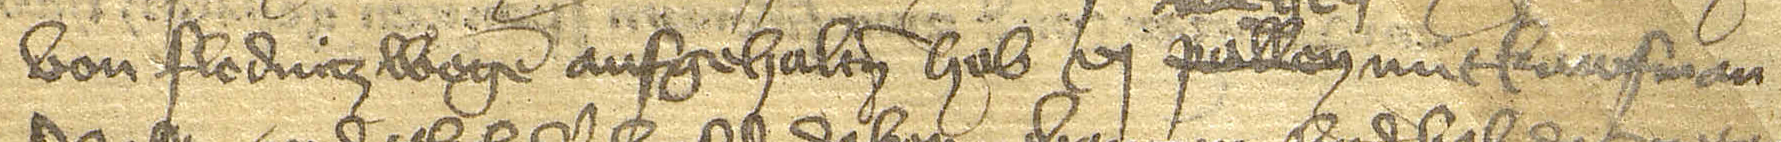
von flednicʒ wege* aufgehaltn* hab vi pallen mit kawfman
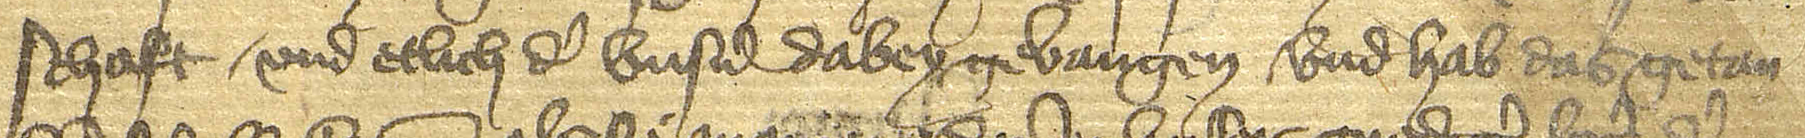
ſchaft / vnd etlich d* vnſn* dabey gevangen / vnd hab das getan
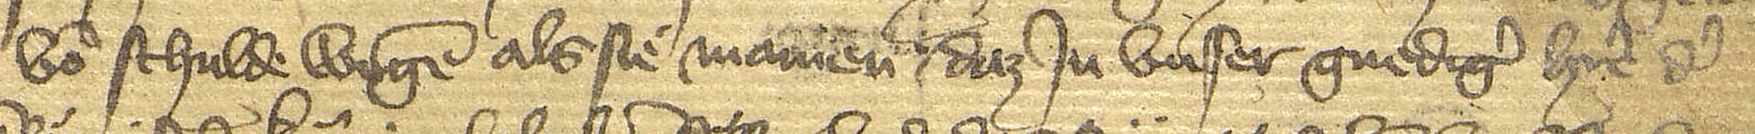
vo* ſchulde wege* als ſie mainen / daʒ In vnſer gnedig* hr*e d*
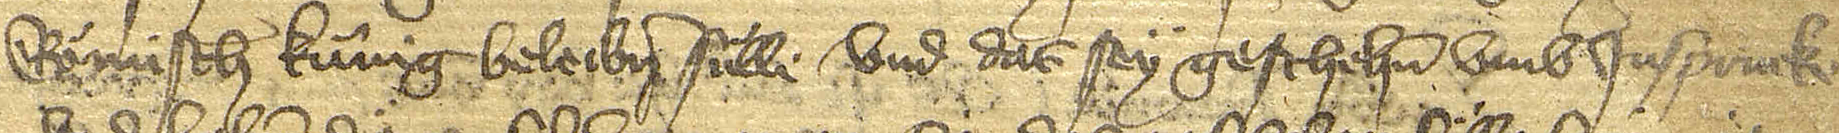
Römiſch* künig beleibn* ſülle / vnd das ſey geſchehn* vmb Inſprücke
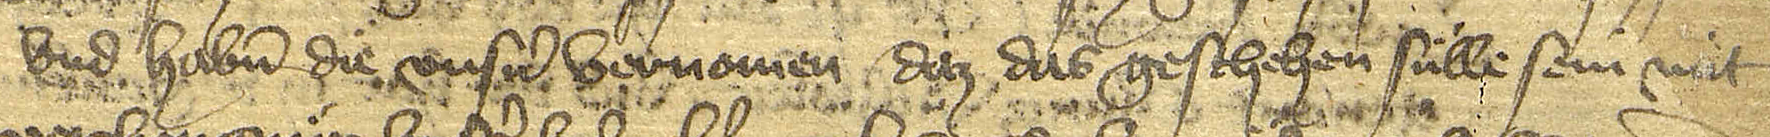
vnd habn* die vnſn* vernomen / daʒ das geſchehen ſülle ſein mit
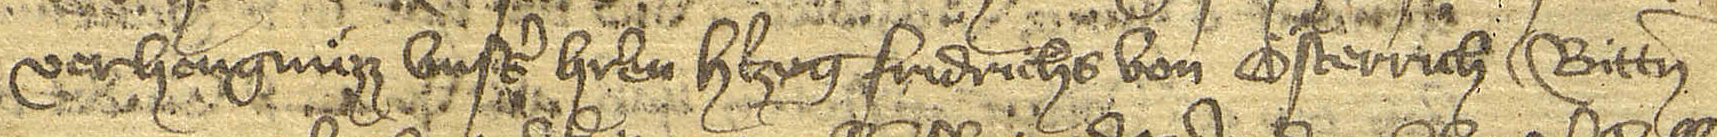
verhengnüʒʒ vnſs* hr*en h*cʒog fridrichs von Öſterrich / Bittn*
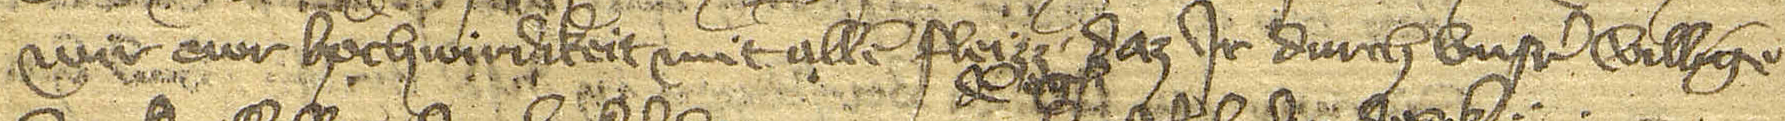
wir ewr hochwirdikeit mit alle* fleiʒʒ / daʒ Ir durch vnſr* willige*
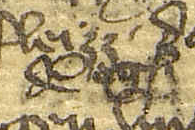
d* eg*
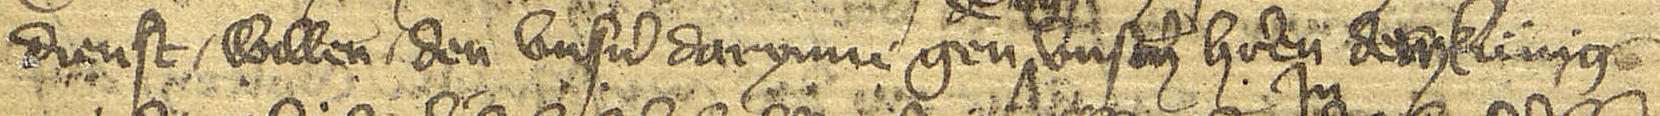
dienſt / wollen / den vnſn* darynne gen vnſm* hr*en dem künig
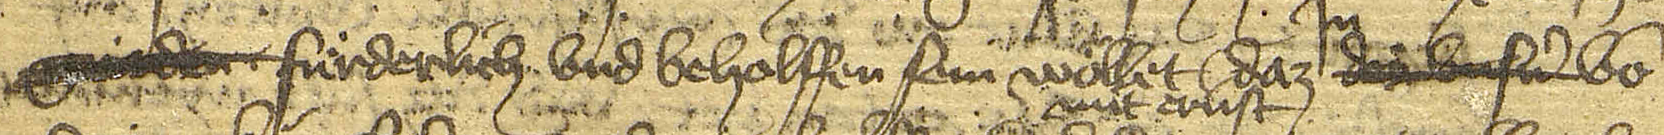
gnaden / fürderlich vnd beholffen ſein wöllet / daʒ den vnſn* vo*
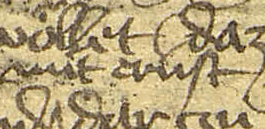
mit ernſt
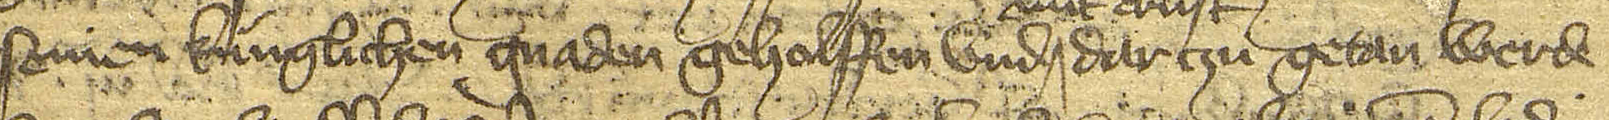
ſeinen künglichen gnaden geholffen vnd dar cʒü getan werde
